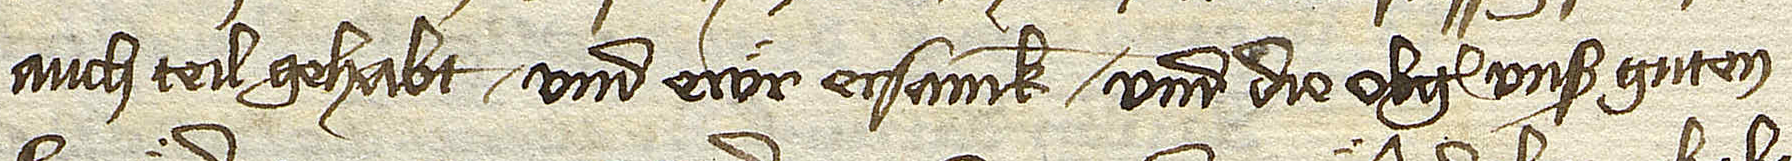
auch teil gehabt / vnd ewr erſamk* / vnd die obg* vnſ* guten
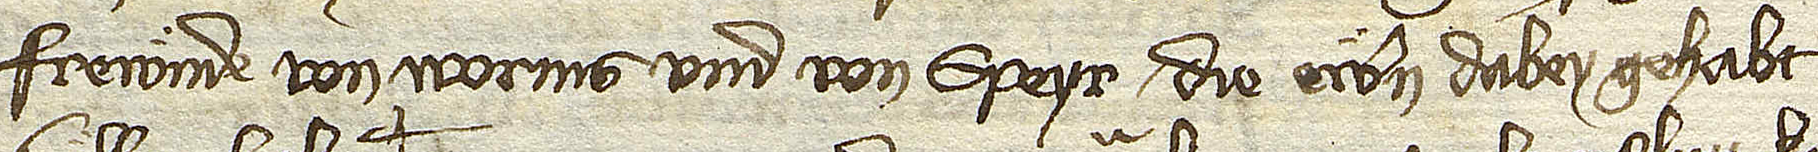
frewnde von worms vnd von Speyr / die ew*n dabey gehabt
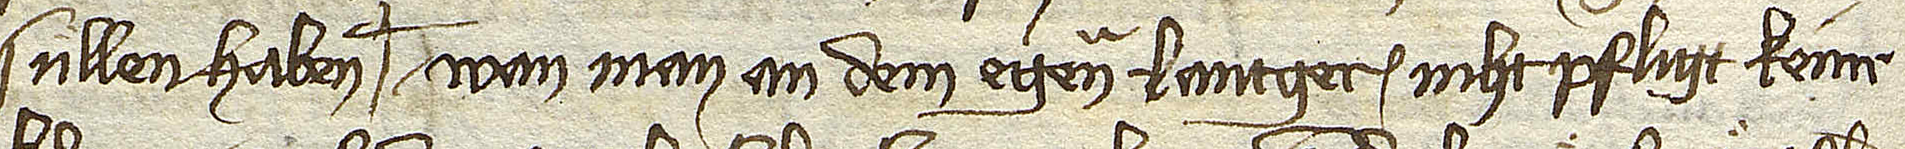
ſüllen haben / wan man an dem egen* lantger* niht pfligt keinr
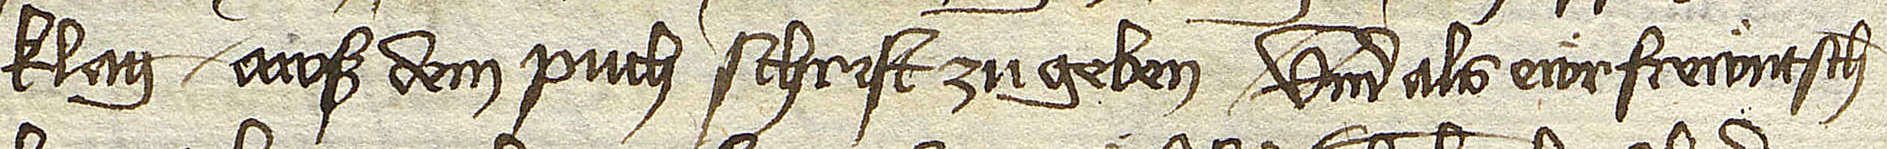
klag / awſʒ dem puch ſchrift ʒu geben / Vnd als ewr frewntſch*
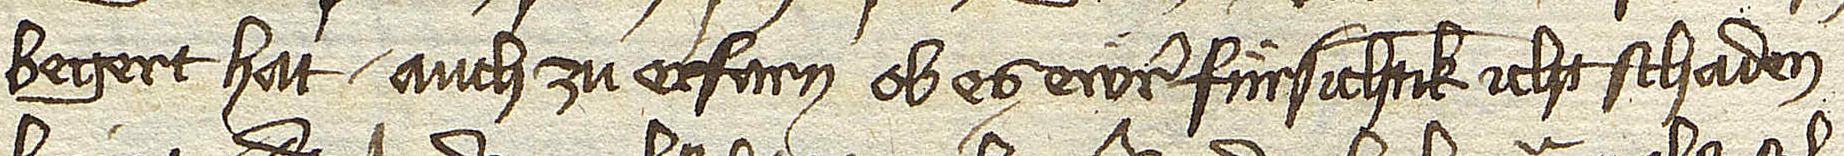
begert hat / auch ʒu erfarn ob es ew*r fürſichtik* icht ſchaden
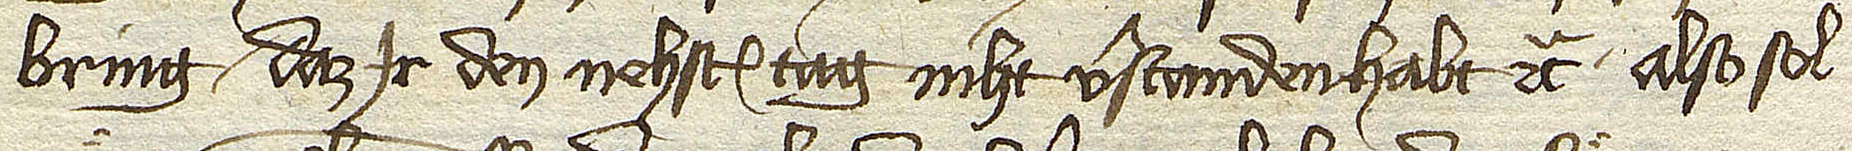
bring / daʒ Ir den nehſt* tag niht v*ſtanden habt ec* / Alſo ſol
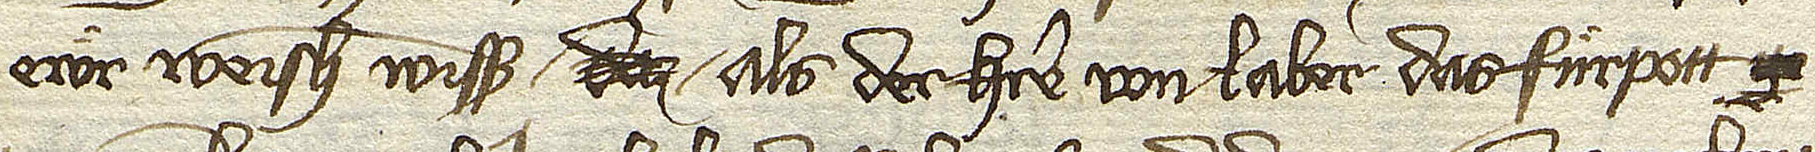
ewr weiſh* wiſſ* / daʒ / als der h*re von laber das fürpott ge
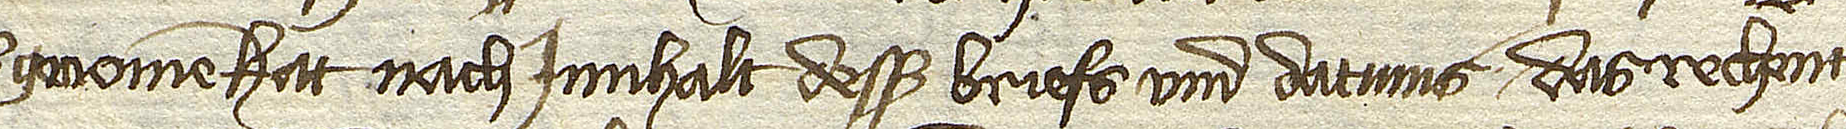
genome* hat nach Innhalt deſſ* briefs vnd datums . / das rechent
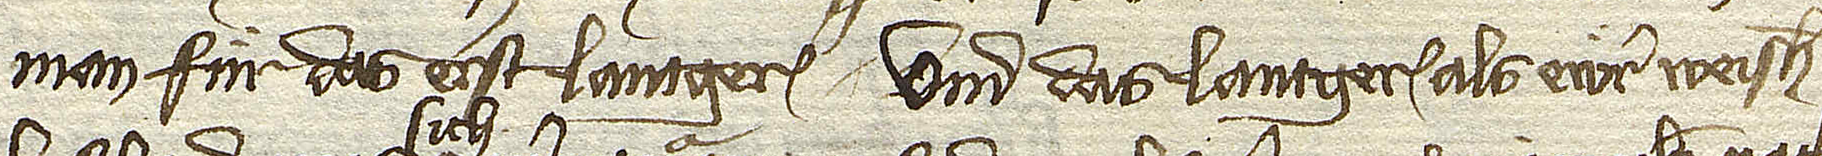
man für das erſt lantger* / Vnd das lantger* als ew*r weiſh*
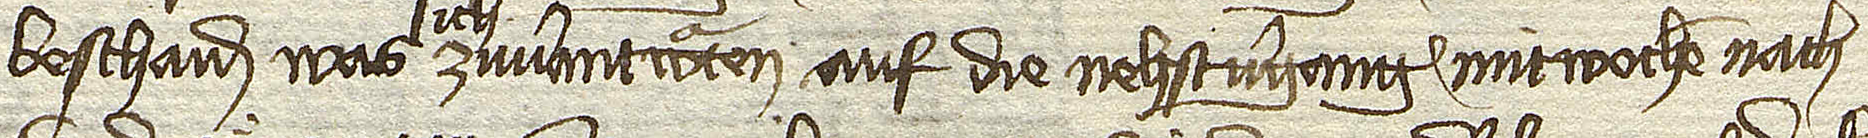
beſchaid* was ʒuu*antw*ten auf die nehſtu*gang* mitwoche* nach
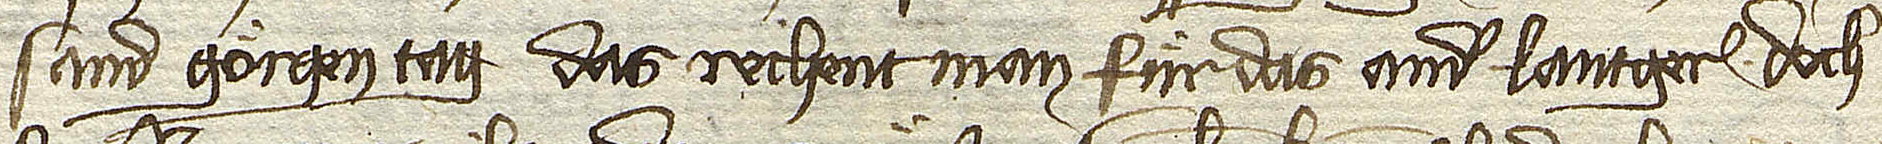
ſand görgen tag das rechent man für das and* lantger* . doch
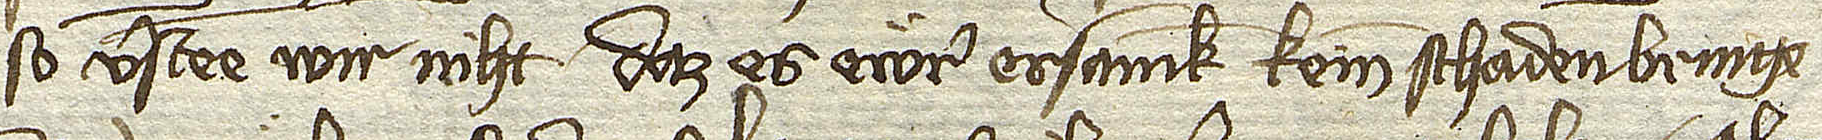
ſo v*ſtee* wir niht / daʒ es ew*r erſamk* kein ſchaden bringe
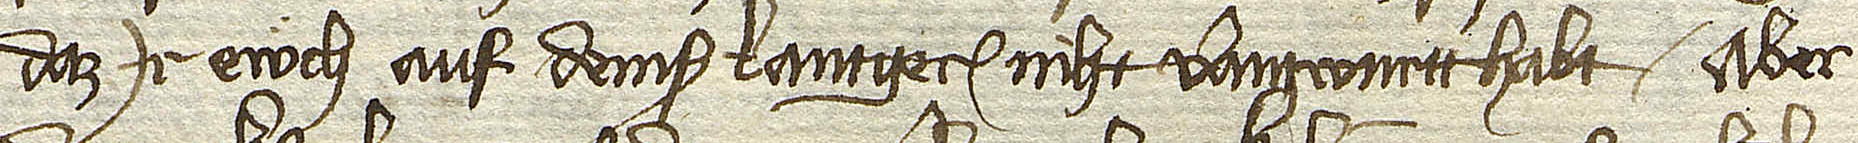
daʒ Ir ewch auf demſ* lantger* niht v*antwurtt habt / Aber
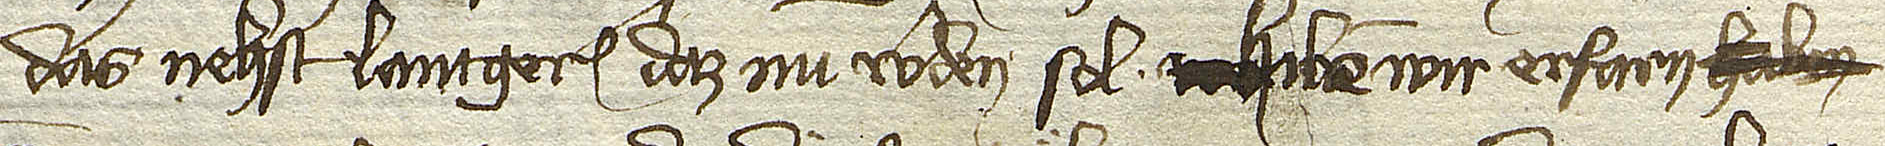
das nehſt lantger* daʒ nu w*den ſol . %%habe* wir erfarn haben
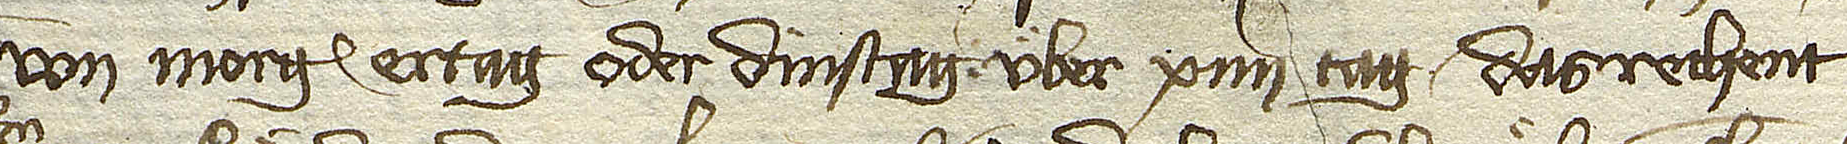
von morg* ertag oder dinſtag v̈ber xiiii tag / das rechent
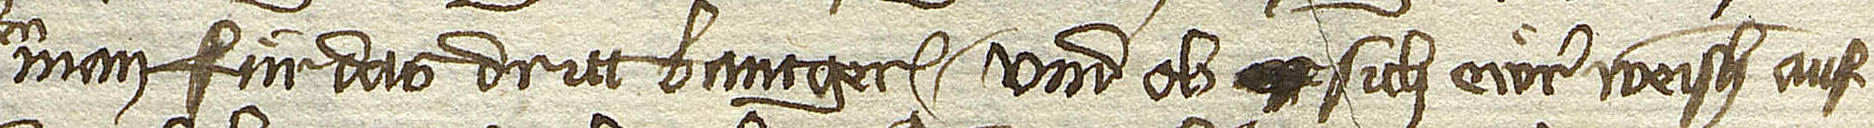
man für das dritt lantger* / vnd ob es ſich ew*r weiſh* auf
